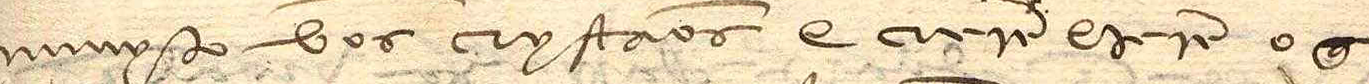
muyto b̄os crystãos e crerē e terē o q̄
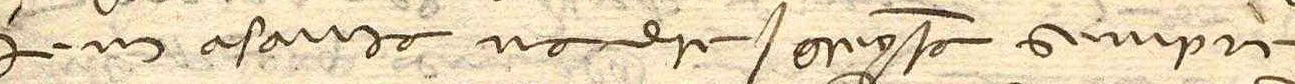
tem a santa madre Jgreyja sempre
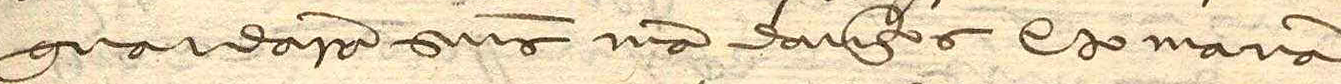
guardarā seus mādamtos e tomarā
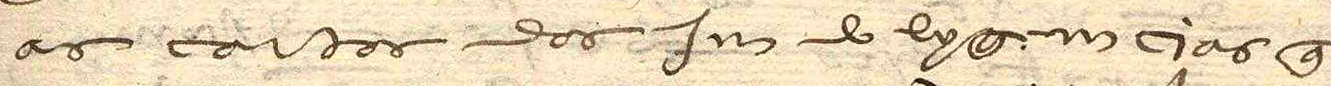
as cartas das Jmdolygemcias q̄
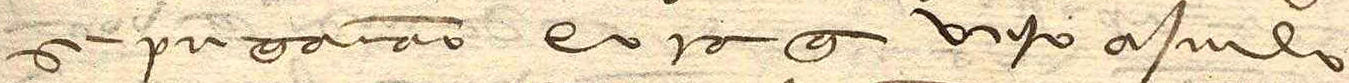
se pregauão e ora q̄ vejo a Jmdo
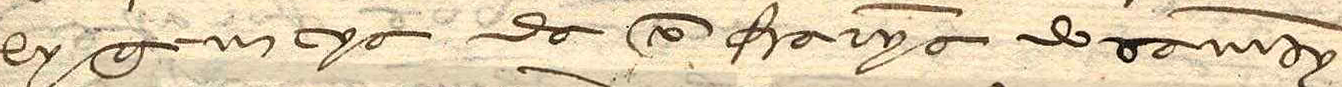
lygemcya da c̄ofrarya do samty
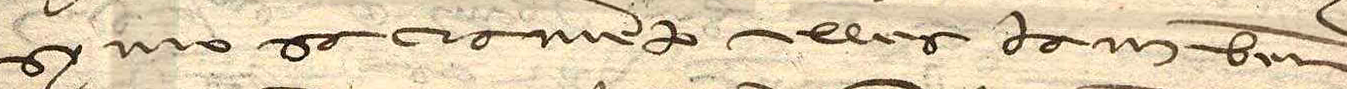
symo sacramēto elles tambem
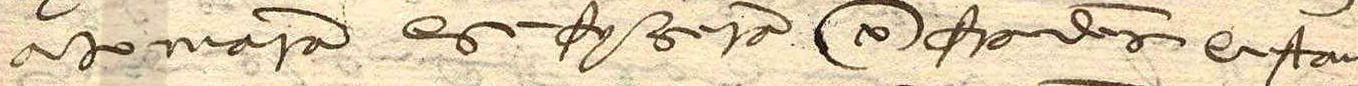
a tomarā e se fyzerā c̄ofrades e estam
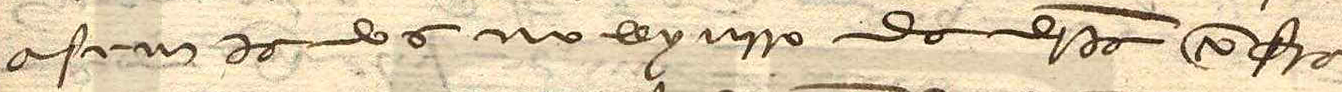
asemtados no llyurro da djta c̄ofra
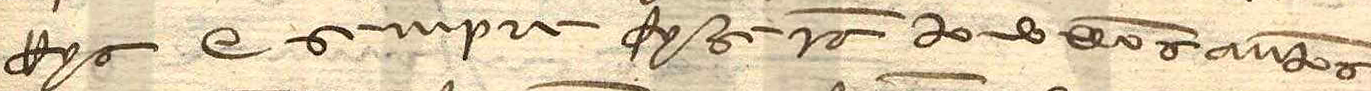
Rya e sempre fyzer̄a todollos autos
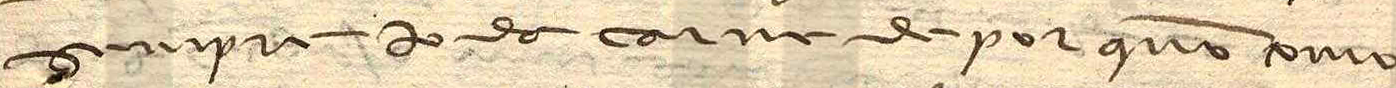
sempre toda carne de porquo como
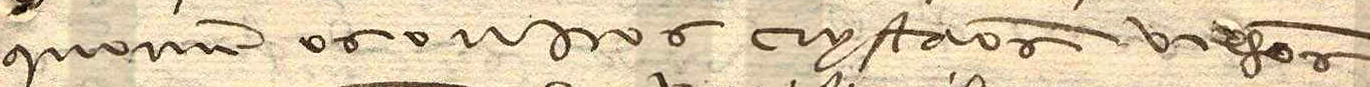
quomē os outros crystaõs velhos
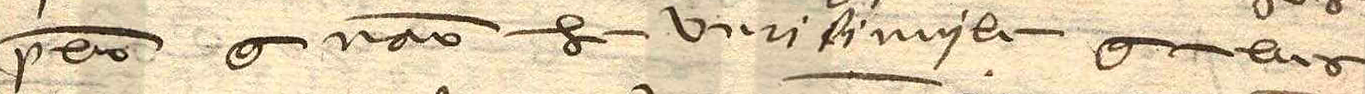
p̄llo q̄ não he verisimjle q̄ elles
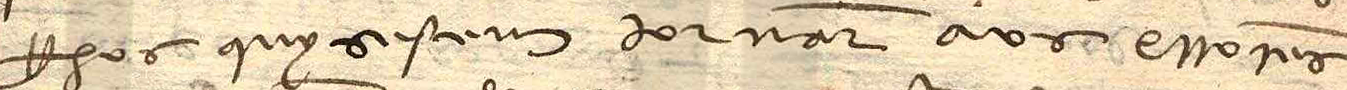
Rꝭos quysesem tornar aos errores
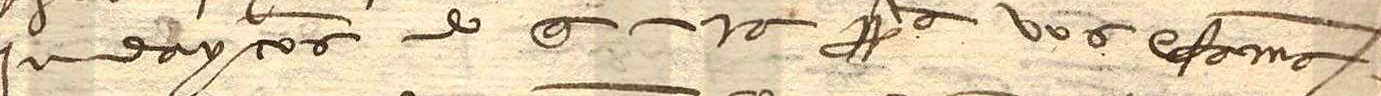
Judaycos do q̄ era ꝓpca vos e fama /
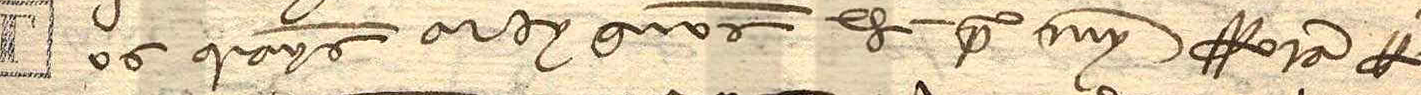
os quays artyguos lhe p̄o m̄y fforā Re
